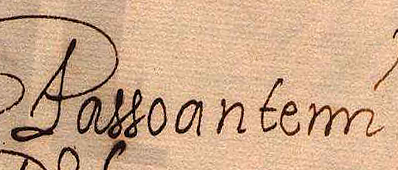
Passo ante mi
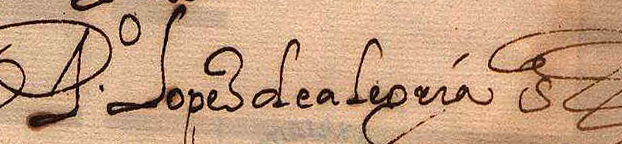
P.o Lopez de alegría
